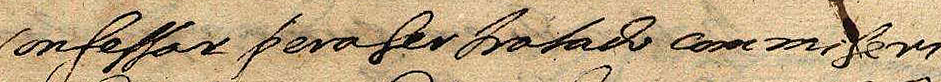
confessar pera ser tratado com miseri
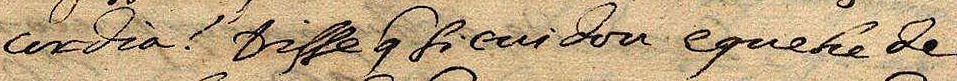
cordia? Disse q̄ si cuidou e que he de
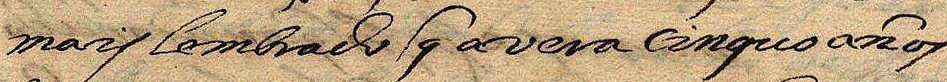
mais lembrado q̄ avera cinquo an̄os
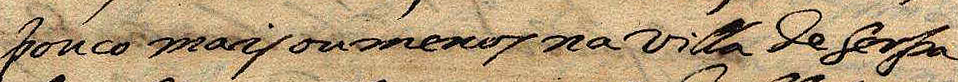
pouco mais ou menos na villa de serpa
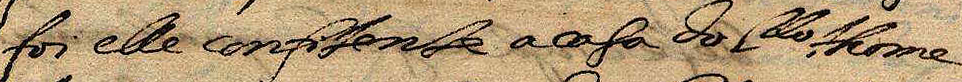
foi elle confitente a casa do Ldo thome
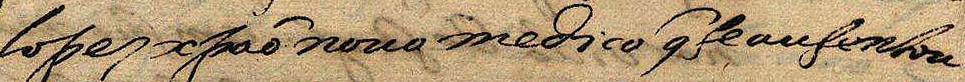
lopez xpaõ nouo medico q̄ se ausentou
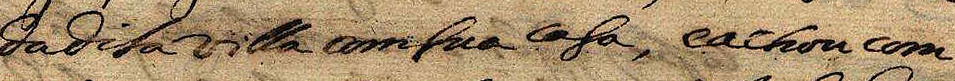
da dita villa com sua casa, e achou com
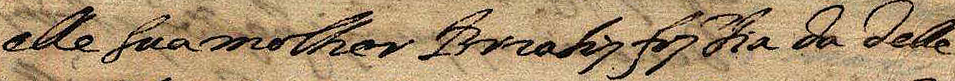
elle sua molher Briatiz frz̄ tia da delle
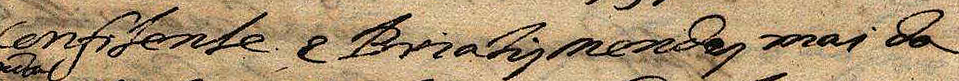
confitente e Briatiz mendez mai da
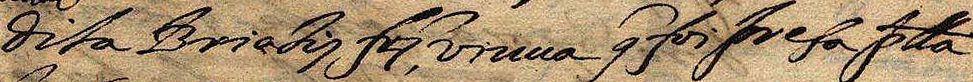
dita Briatiz frz, viuua q̄ foi presa p̄lla
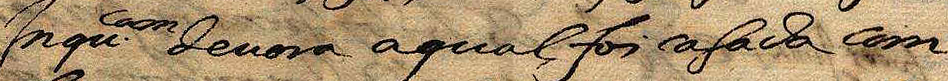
Jnqu.cam deuora a qual foi casada com
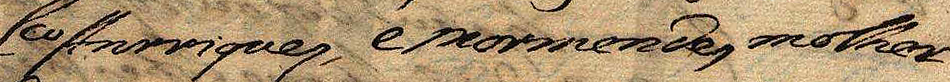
Lco Anrriquez, e mor mendez molher
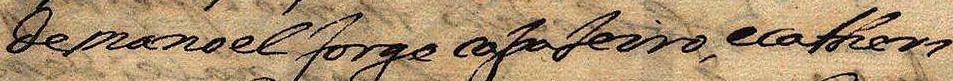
de manoel Jorge capateiro, e catheri
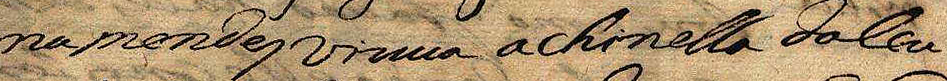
na mendez viuua a chinella dalcu
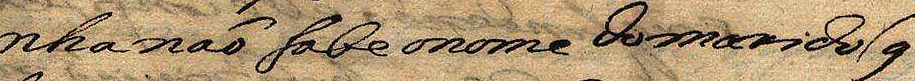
nha naõ sabe o nome do marido q̄
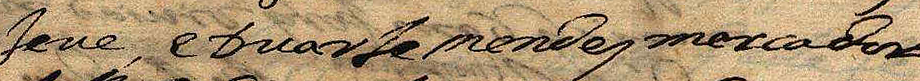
teue, e Duarte mendez mercador
